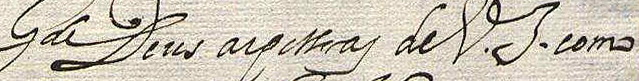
Gde Deus as pessoas de V. J. como
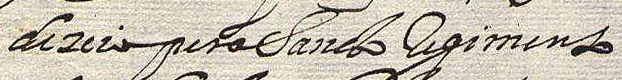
dezeio per o Sancto Regimento
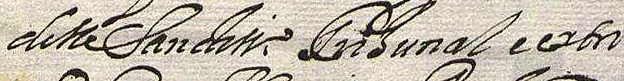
desse Sanctiss.o Tribunal e extri
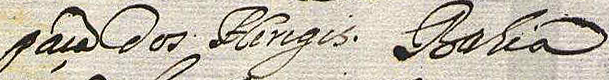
paçaꝭ dos Hereges. Bahia
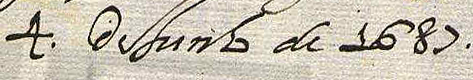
4. de Junho de 1687.
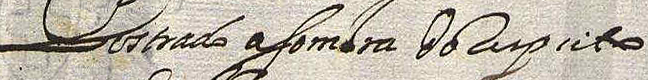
Postrado a sombra do Respeito
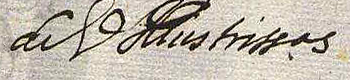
de V Illustriss.as
